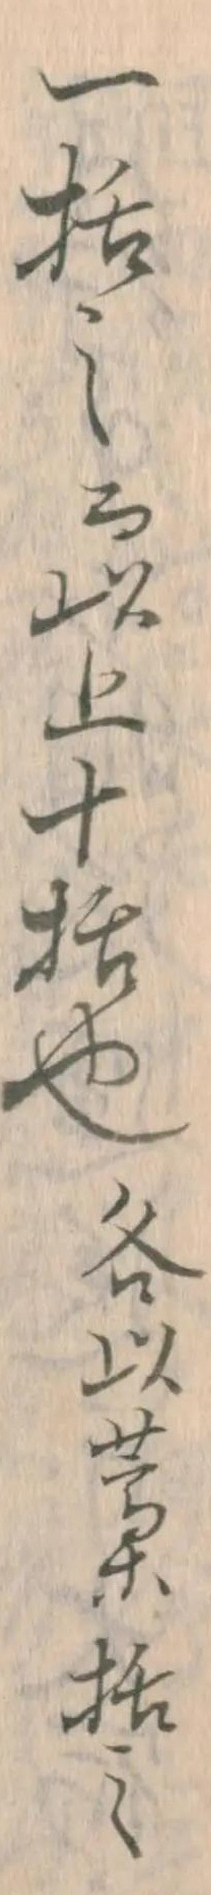一括之而以上十括也各以藁括之
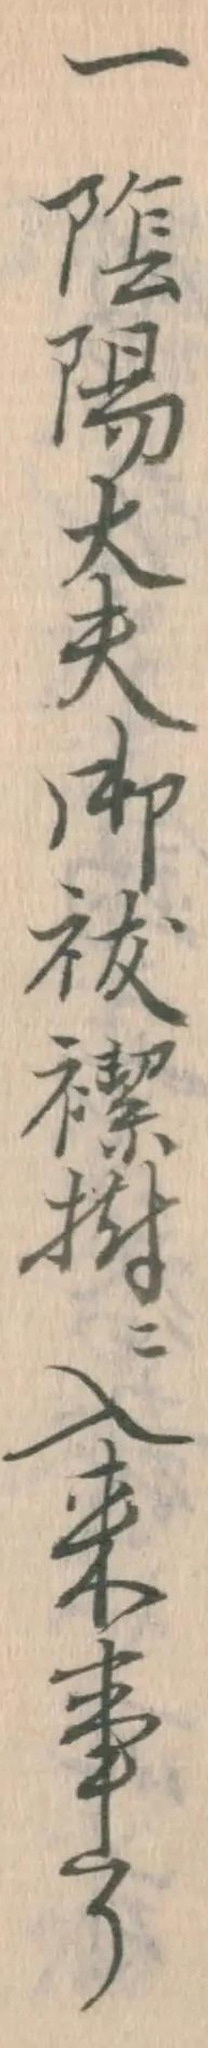一陰陽大夫御祓禊樹に入来事了
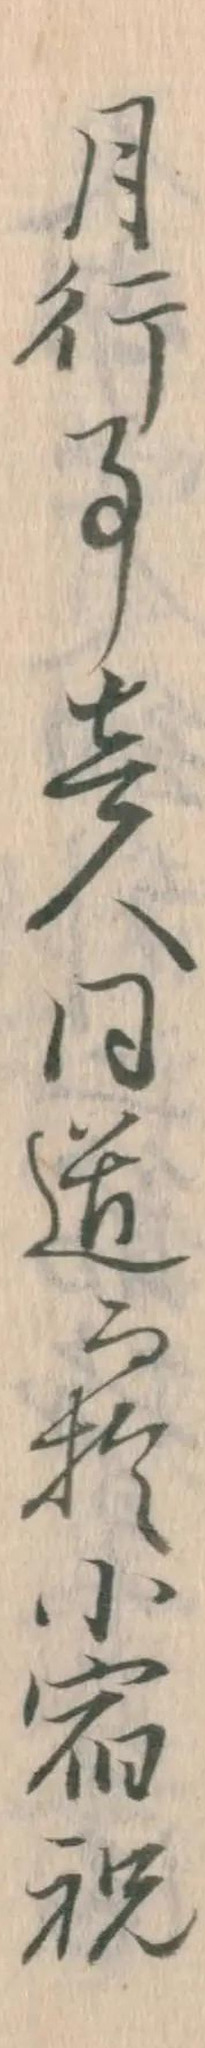月行事壱人同道而於小宿祝
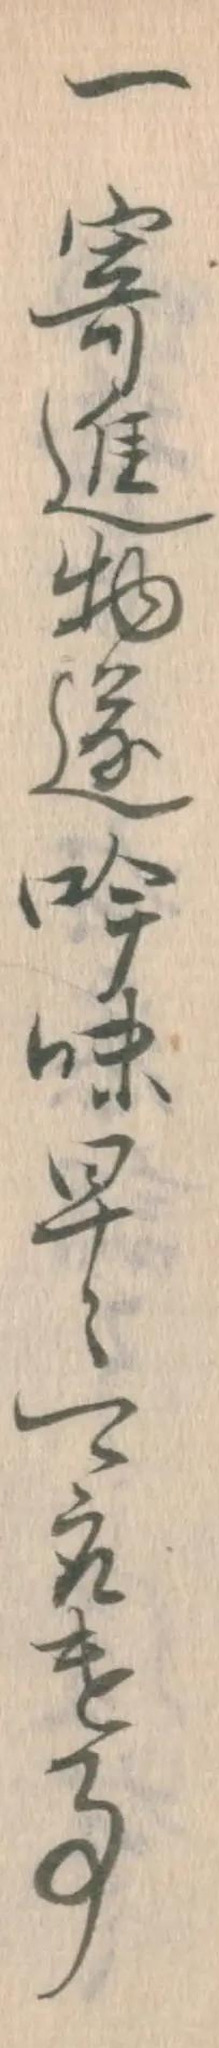一寄進物遂吟味早々可取遣事
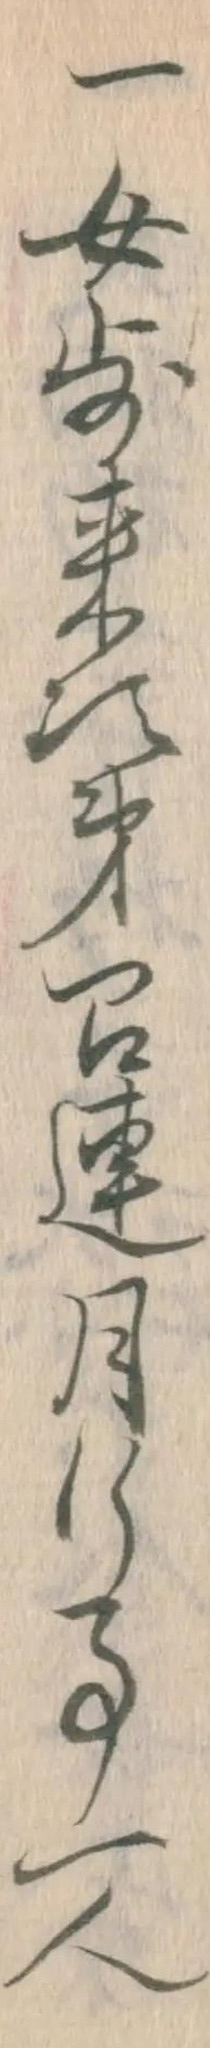一女歩来次第召連月行事一人
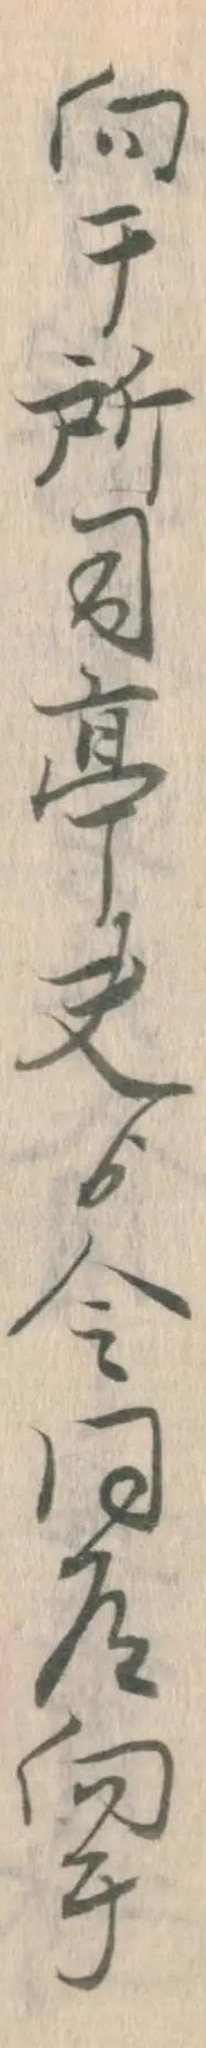向于所司亭夫ゟ令同道向于

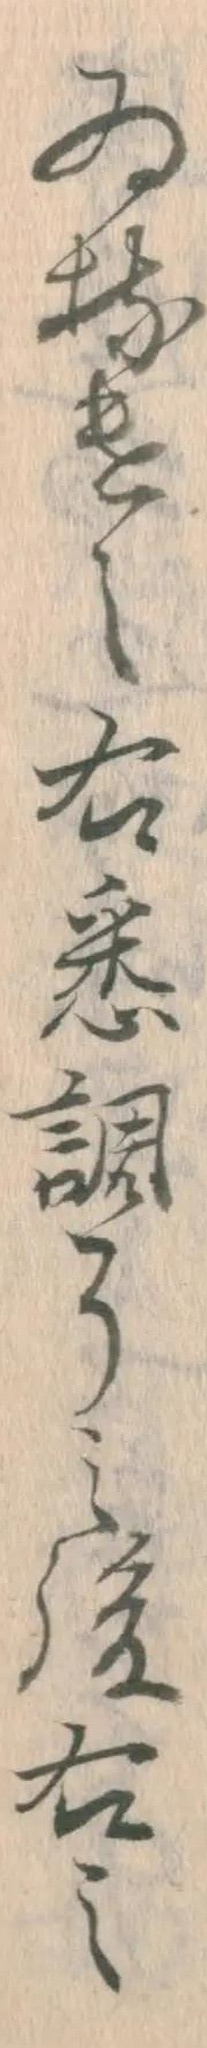為持遣之右悉調了之後右之
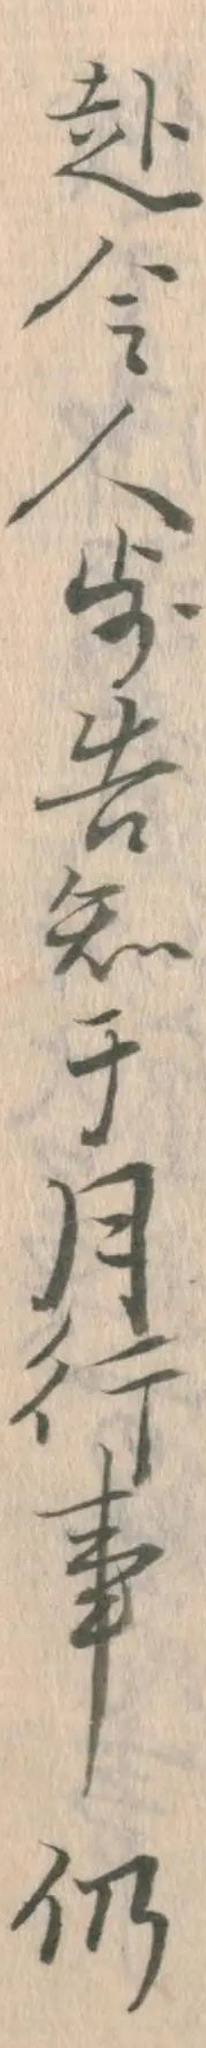赴令人歩告知于月行事仍
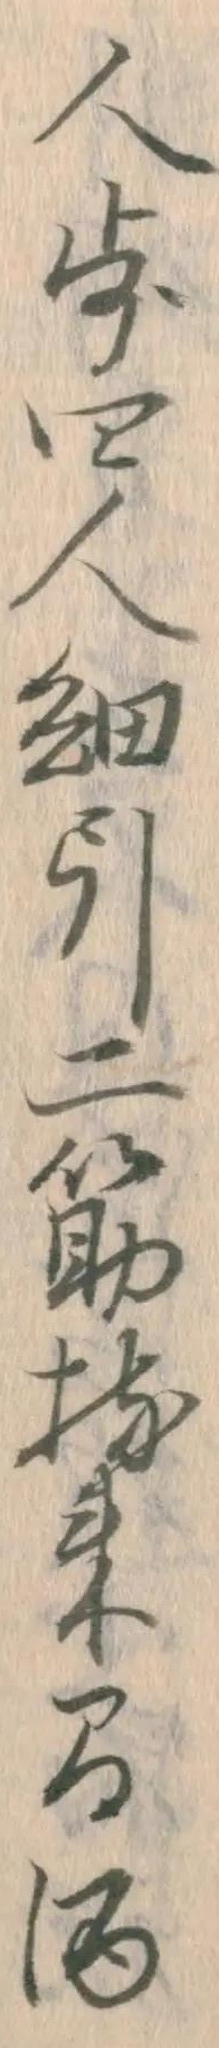人歩四人細引二筋持来間酒
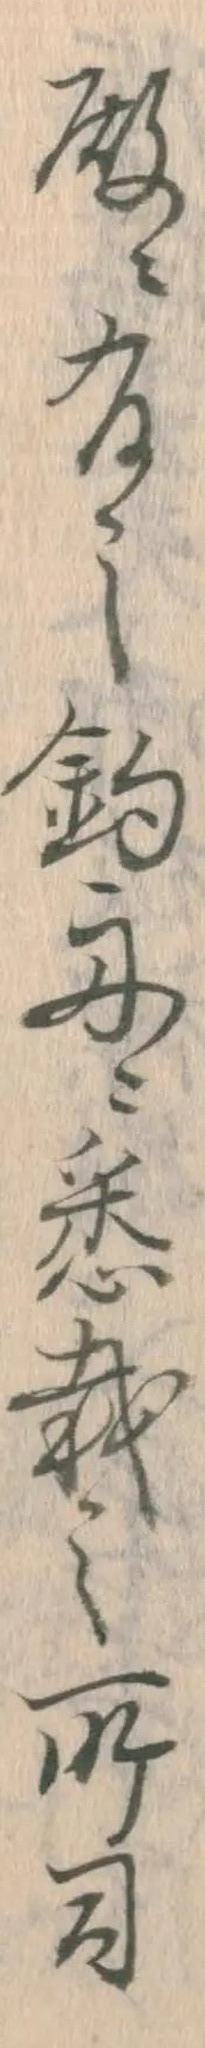殿に有之釣舟に悉載之所司
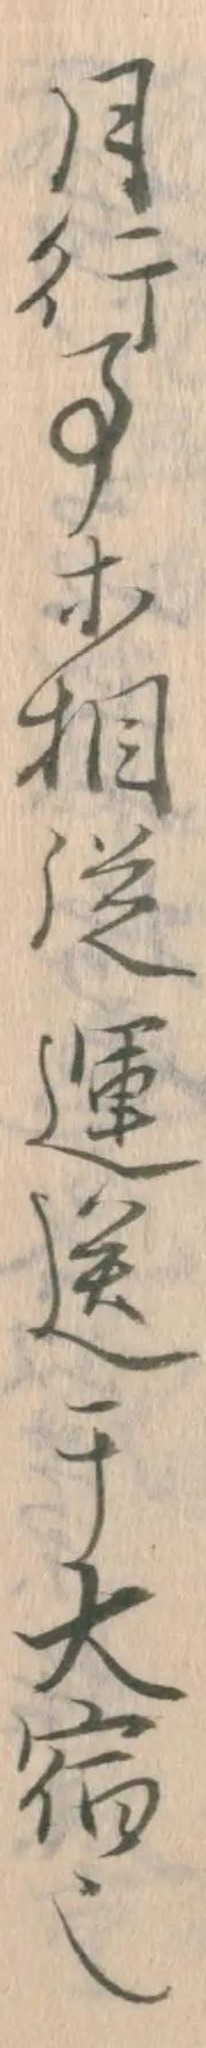月行事等相従運送于大宿也
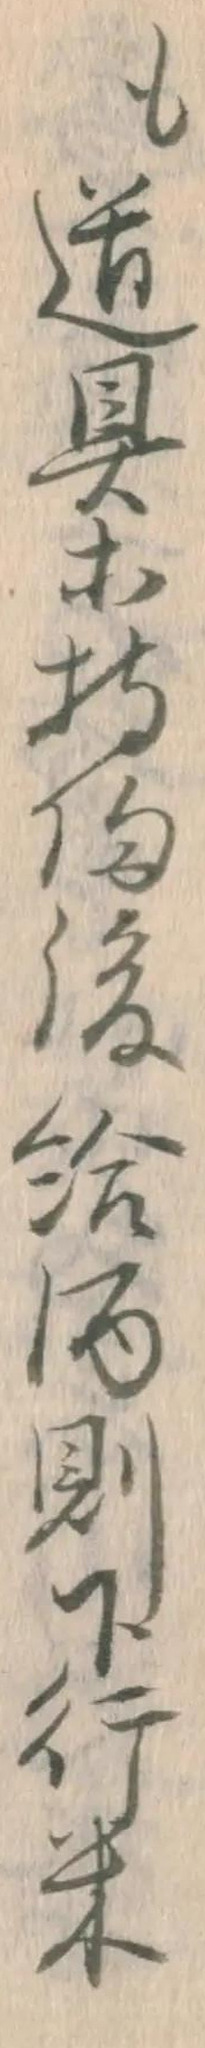も道具等持帰後給酒則下行米
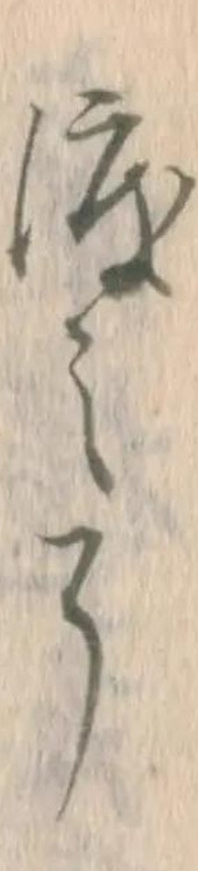渡之了
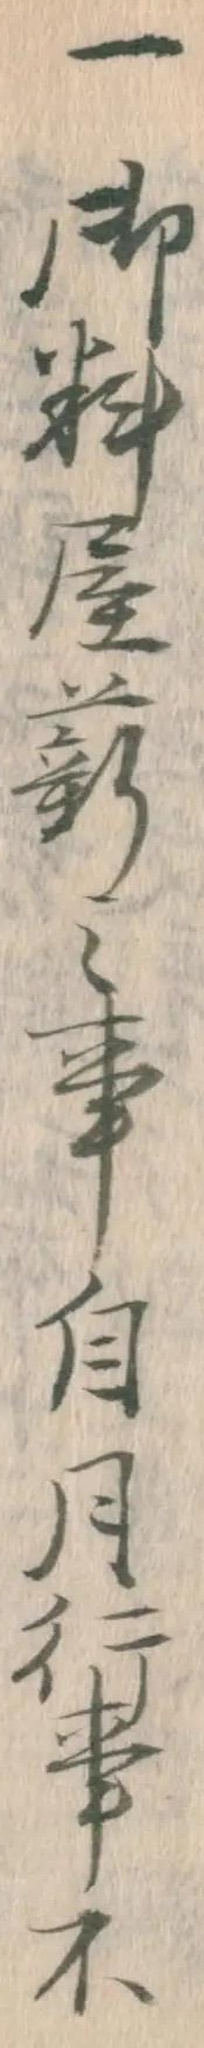一御料屋薪之事自月行事不
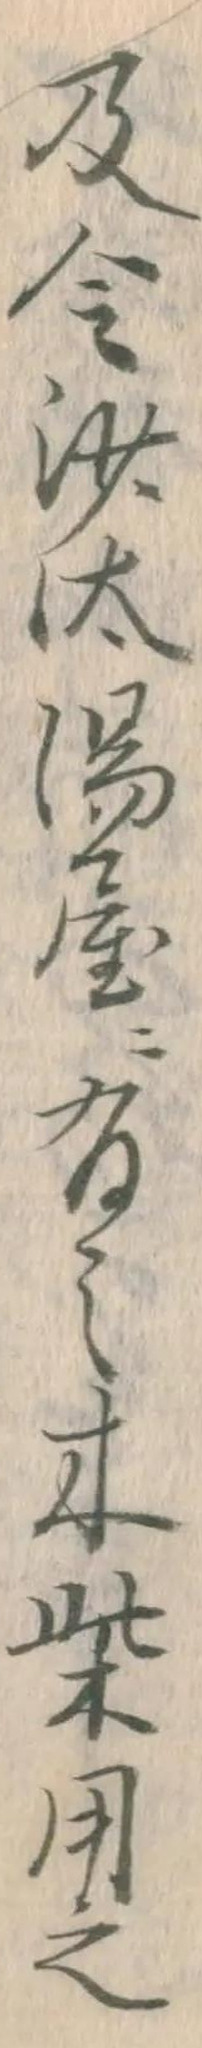及令沙汰湯屋に有之木柴用之
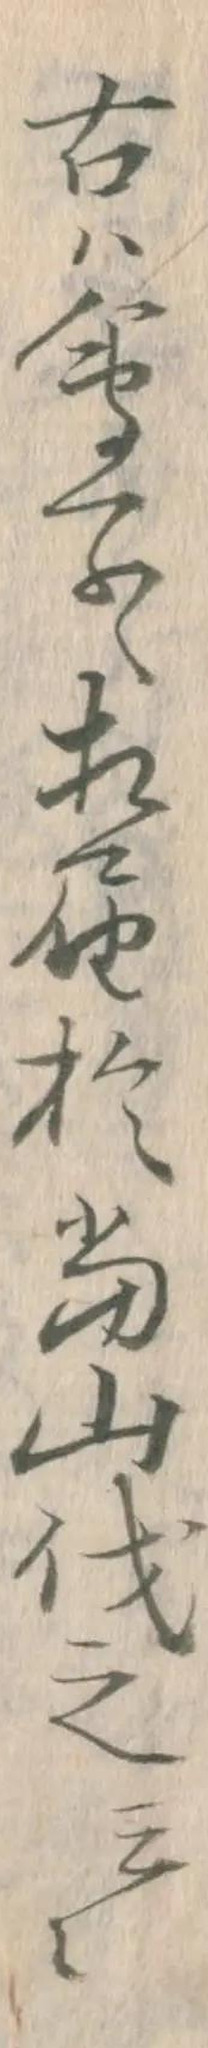古は会所へ相届於当山伐之云々
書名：賀茂社記録. 第81冊
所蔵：国立国会図書館 National Diet Library, JAPAN
